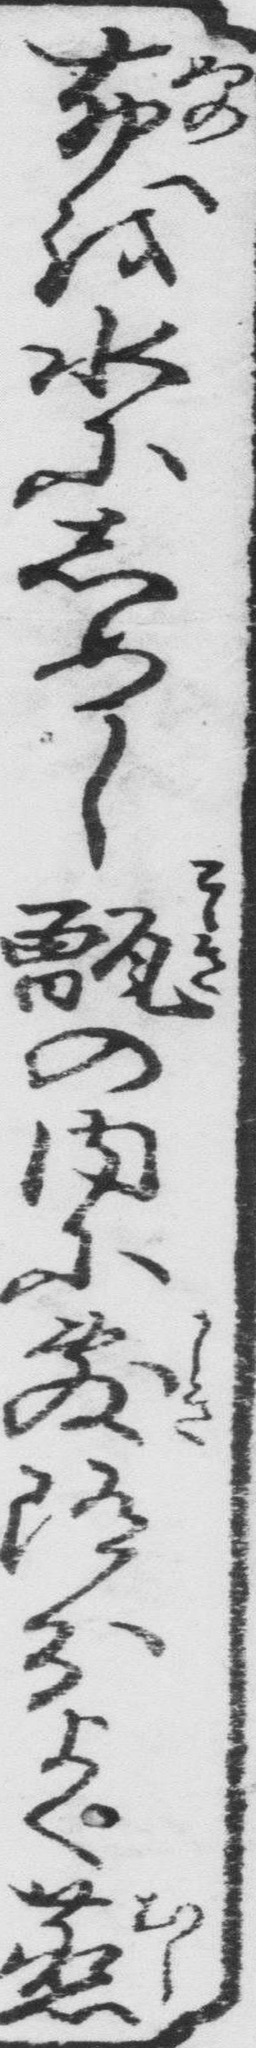布を水にしめし甑の内に敷随分よく蒸
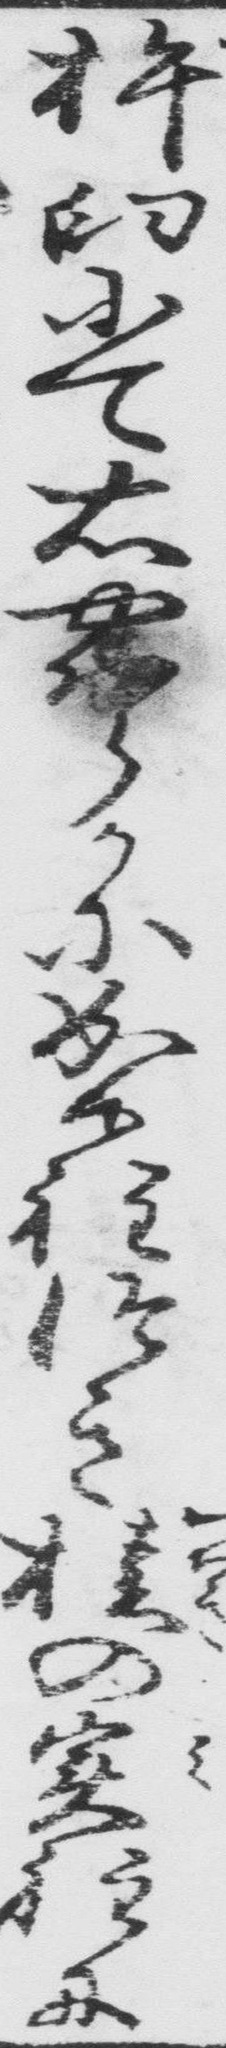杵臼にて右やはらかに成候程つき椿の実程に
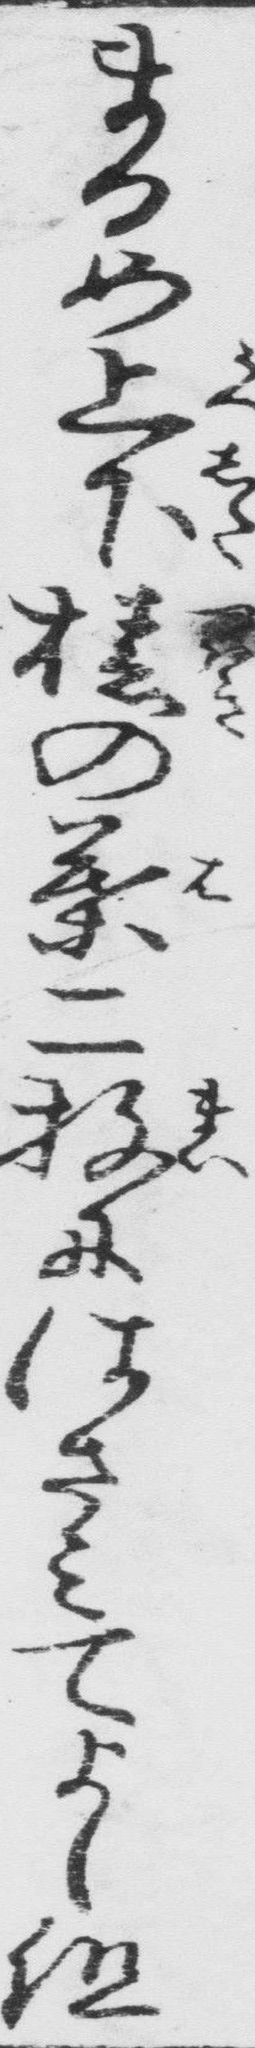まるめ上下椿の葉二枚にはさみてよし但
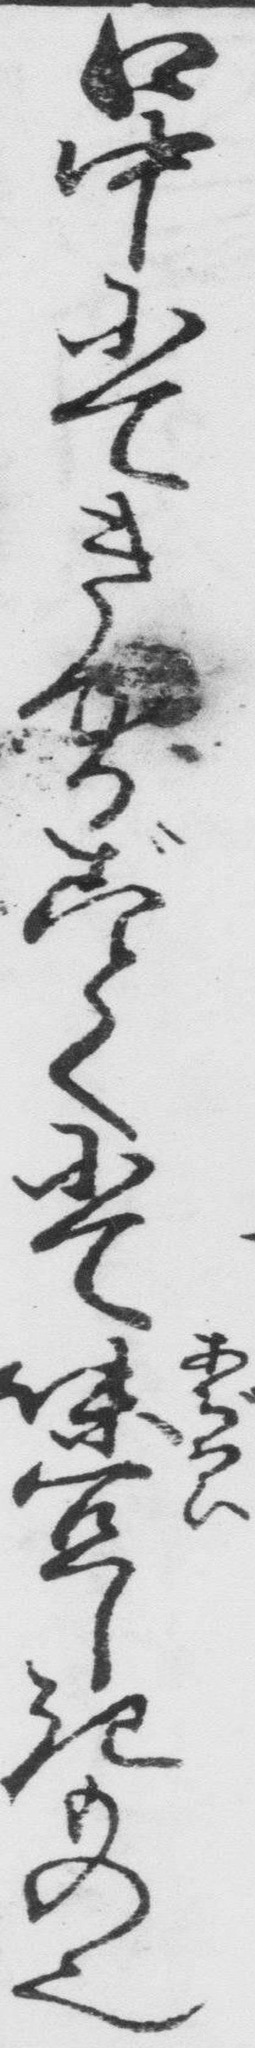口中にてきゆるごとくにて味宜しきもの也
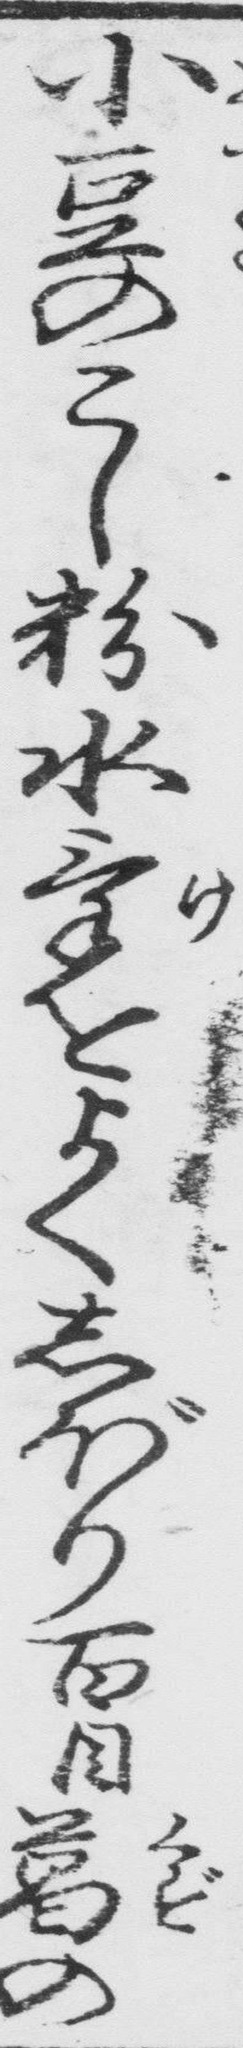小豆のこし粉水気をよくしぼり百目葛の
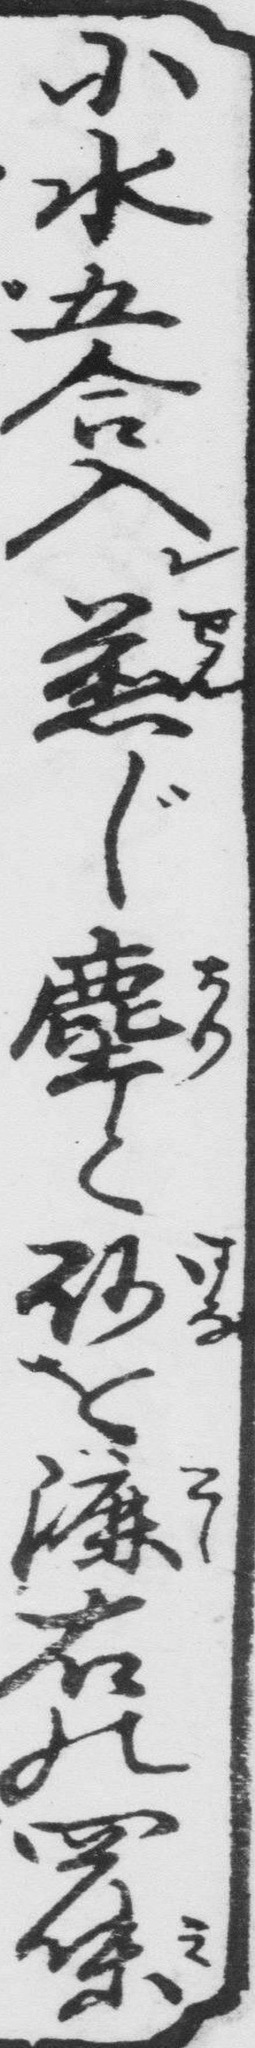に水五合入れ煎じ塵と砂を漉右の四味
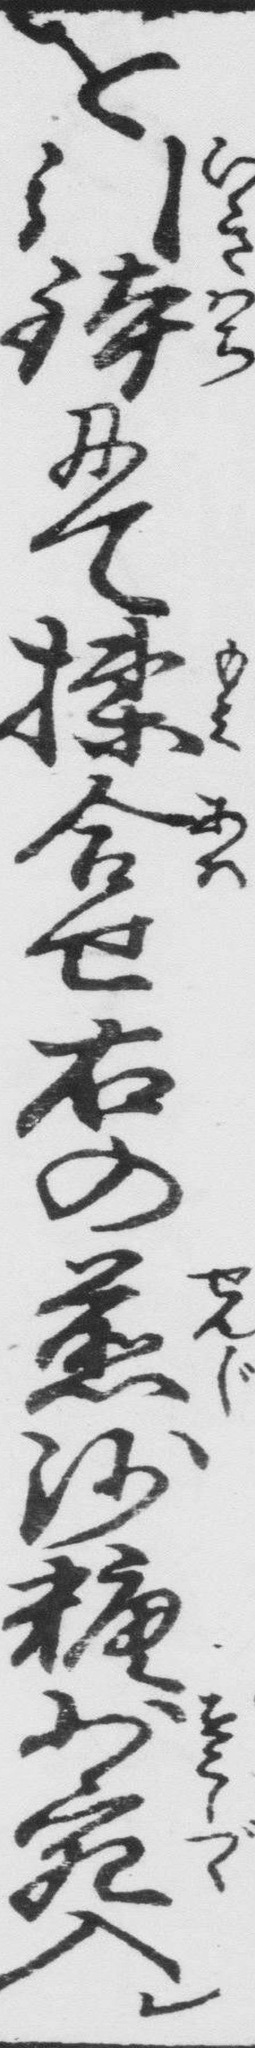を引鉢にて揉合せ右の煎沙糖少宛入れ
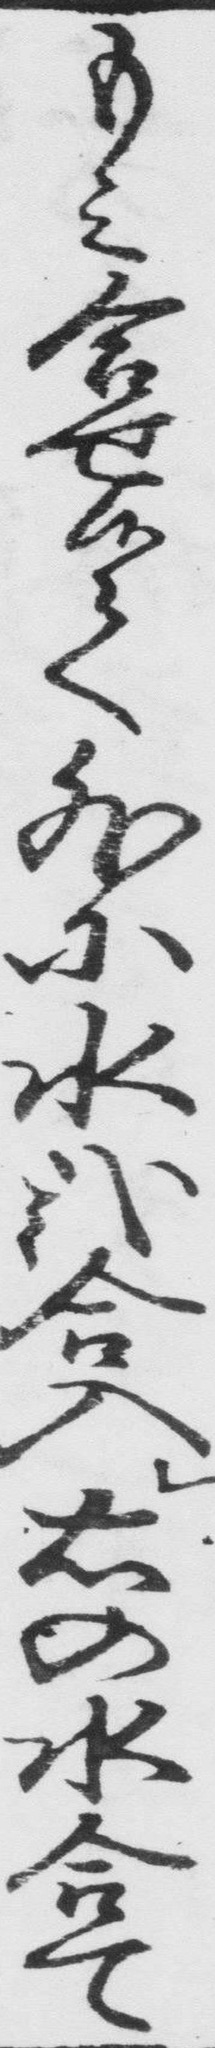もみ合せ候て外に水弐合入れ右の水合て
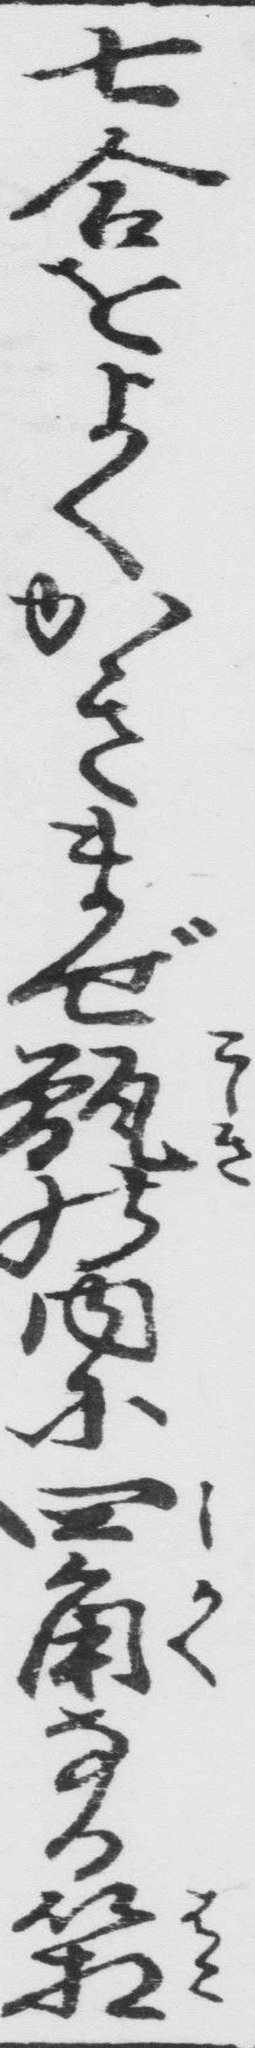七合をよくかきまぜ甑の内に四角なる箱
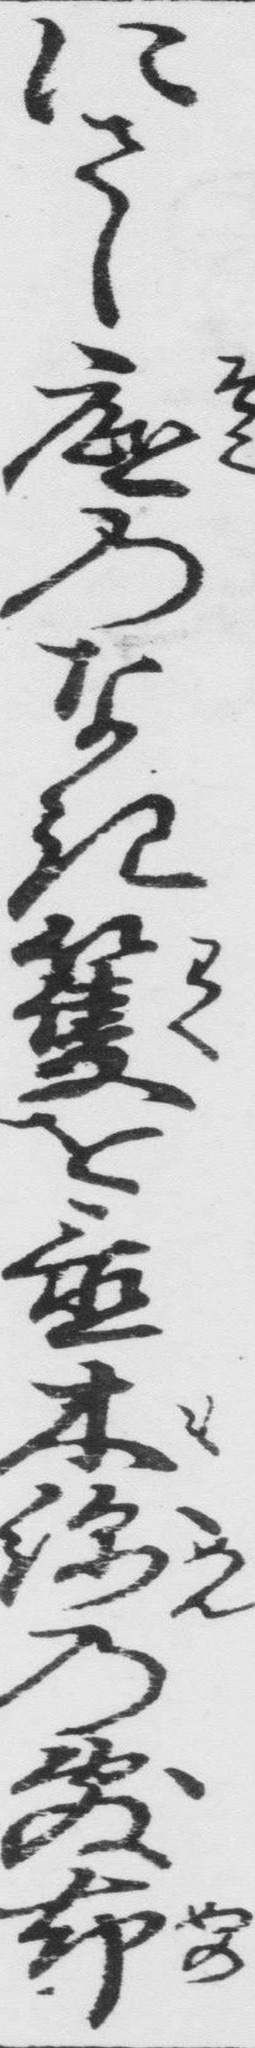にさし底のなき籰を置木綿の敷布
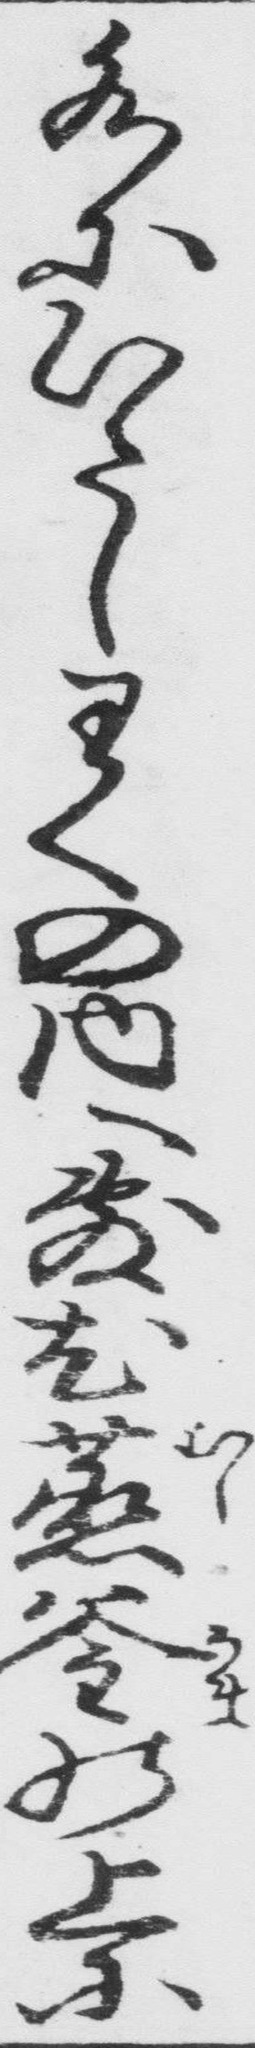水にひたしわくの内へ敷尤蒸釜の上に
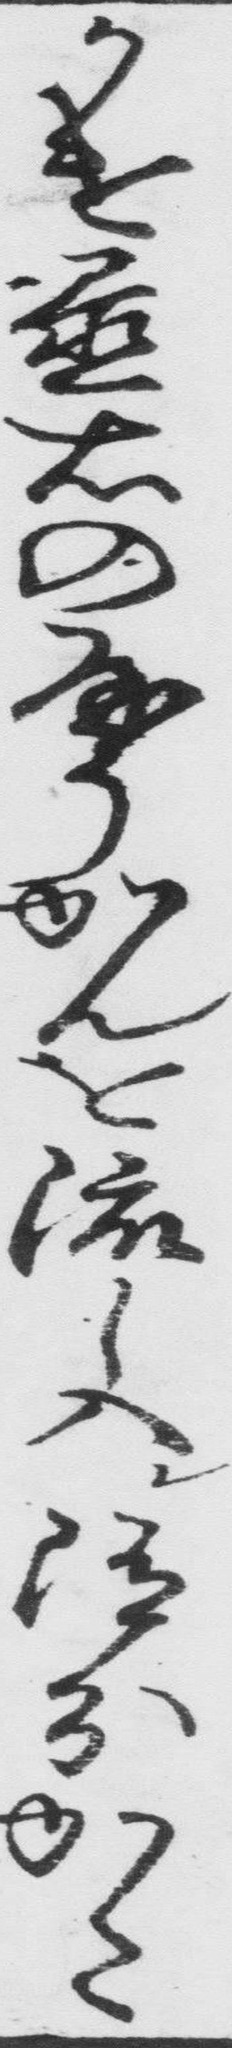かけ置右のやうかんを流し入れ随分かた
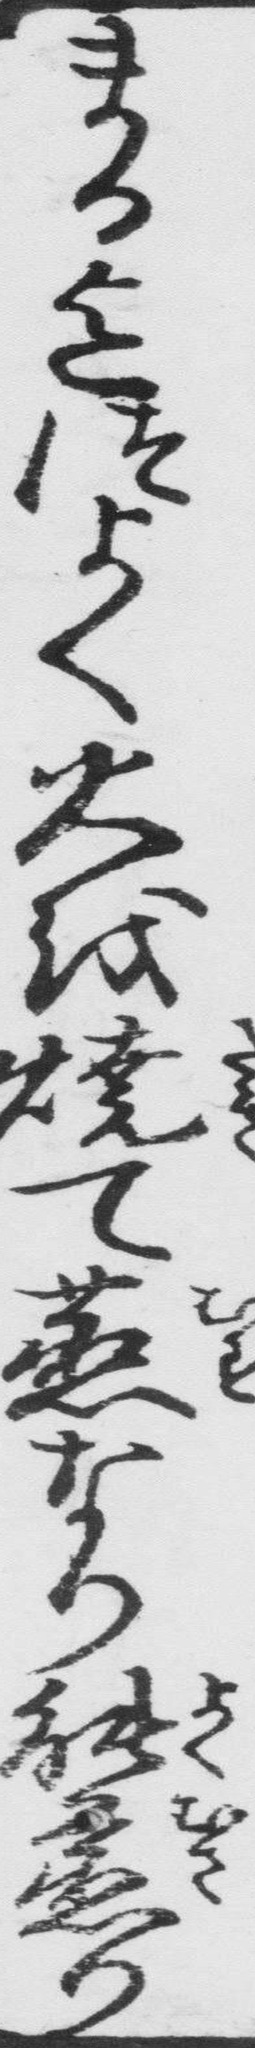まる迄つよく火を焼て蒸なり能蒸り

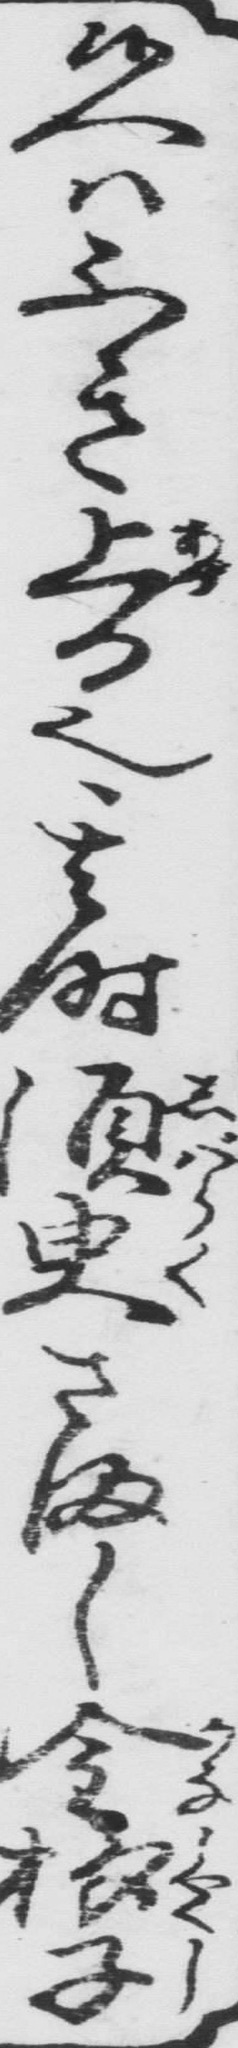候へはふき上る也其時須臾さまし金杓子
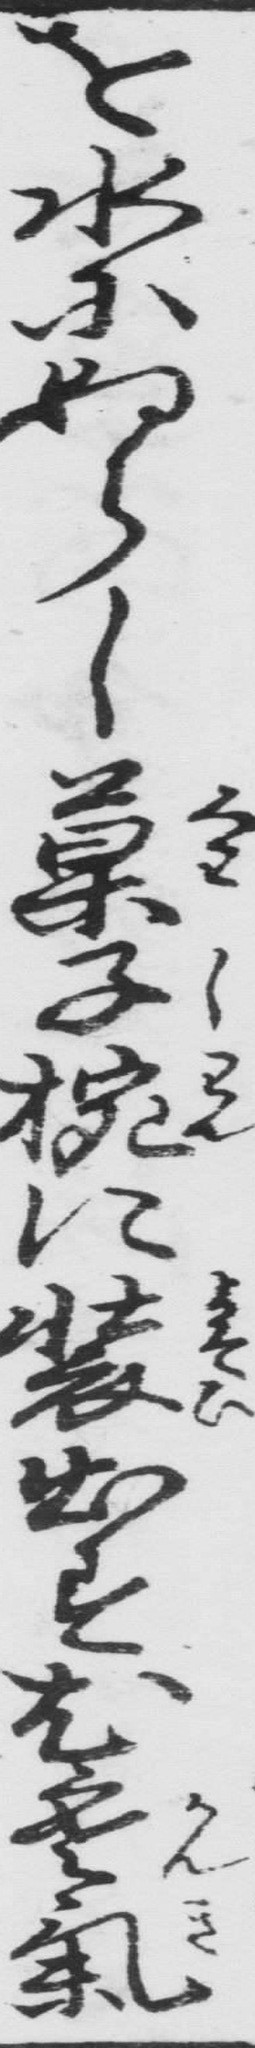を水にぬらし菓子椀に装出す尤寒気
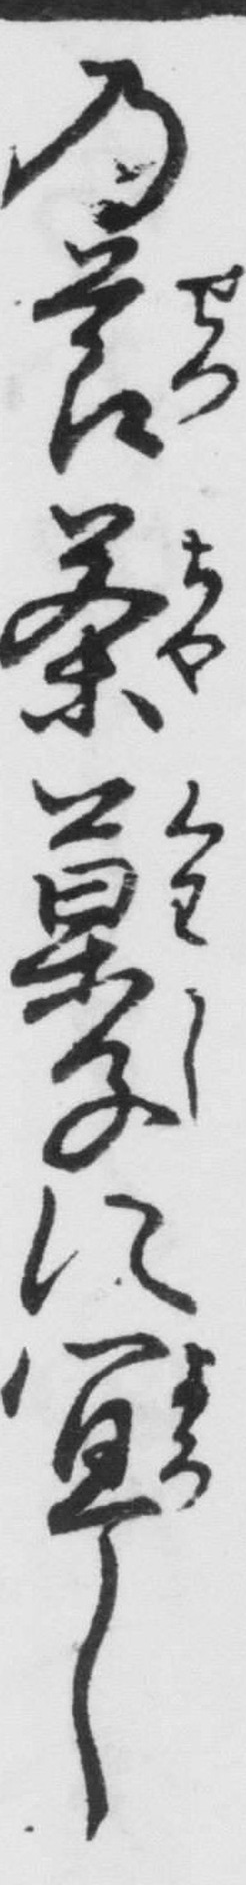の節茶菓子に宜し
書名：御前菓子図式
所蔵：大阪府立大学学術情報センター 国文学研究資料館
